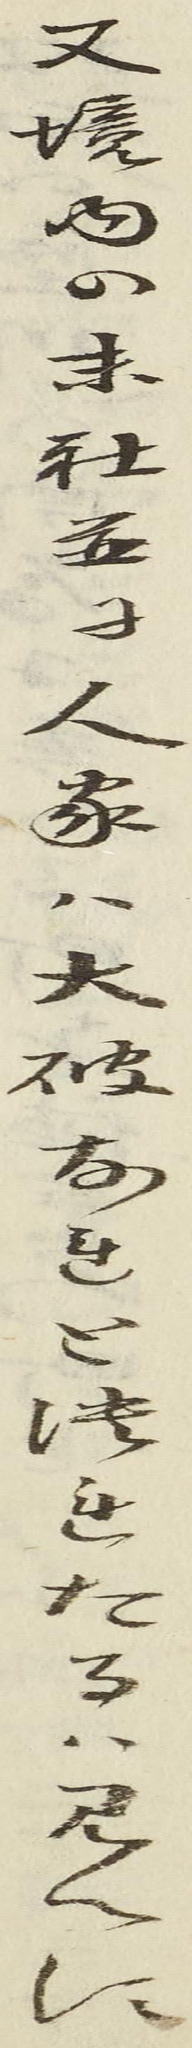又境内の末社並に人家ハ大破なれと潰れたるハ見へす
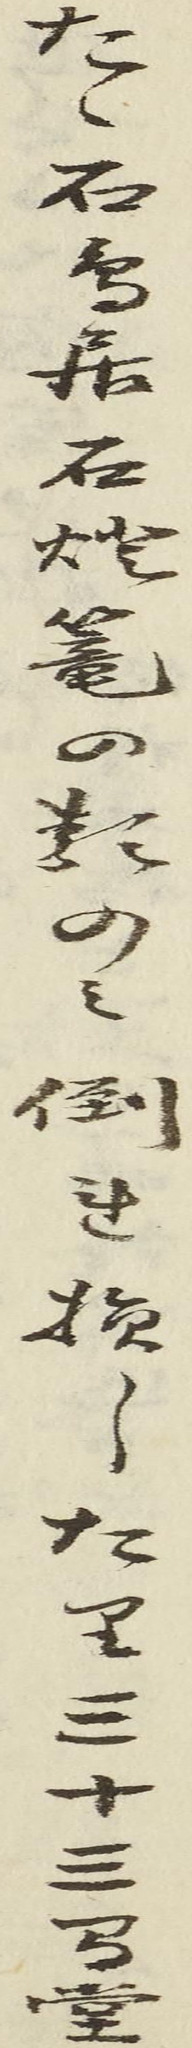たゝ石鳥居石燈籠の類のミ倒れ損したり三十三間堂
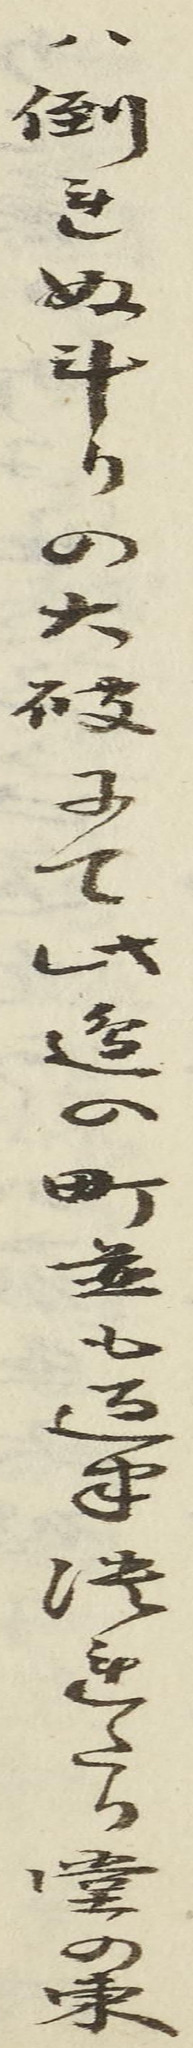ハ倒れぬ斗りの大破にて此辺の町並も過半潰れたり堂の東
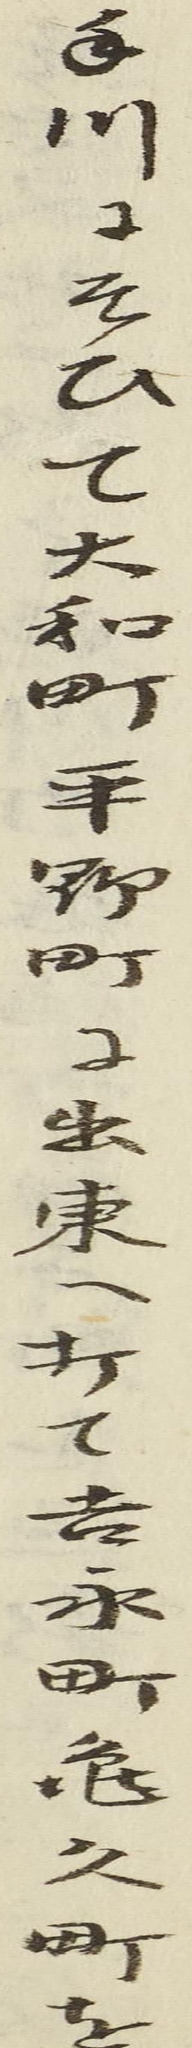手川にそひて大和町平野町に出東へ折て吉永町亀久町を

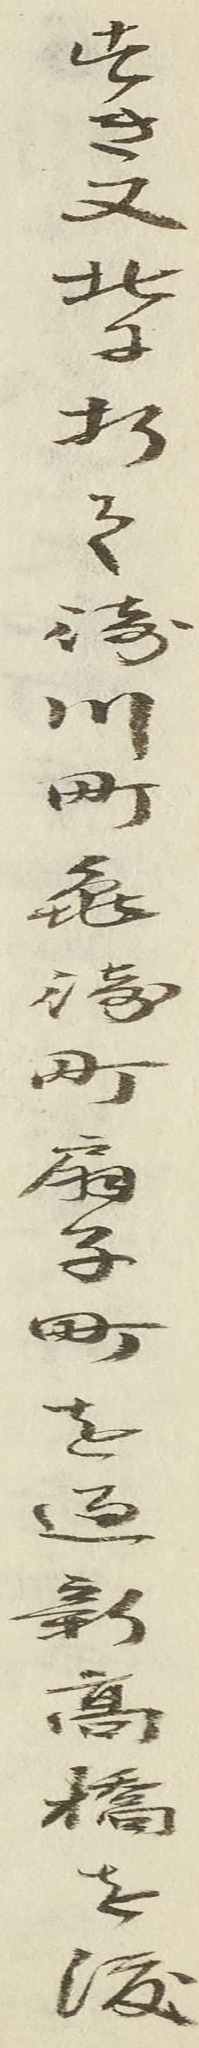すき又北に折て崎川町亀崎町扇子町を過新高橋を渡
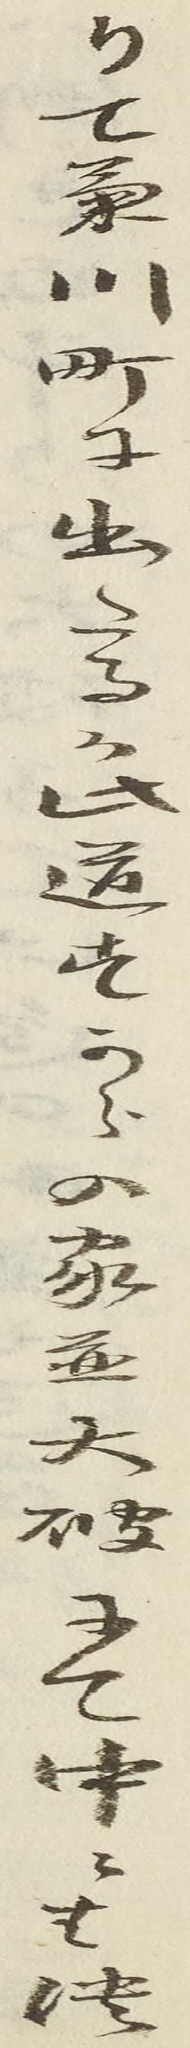りて菊川町にでたるか此道すからの家並大破にて中には潰
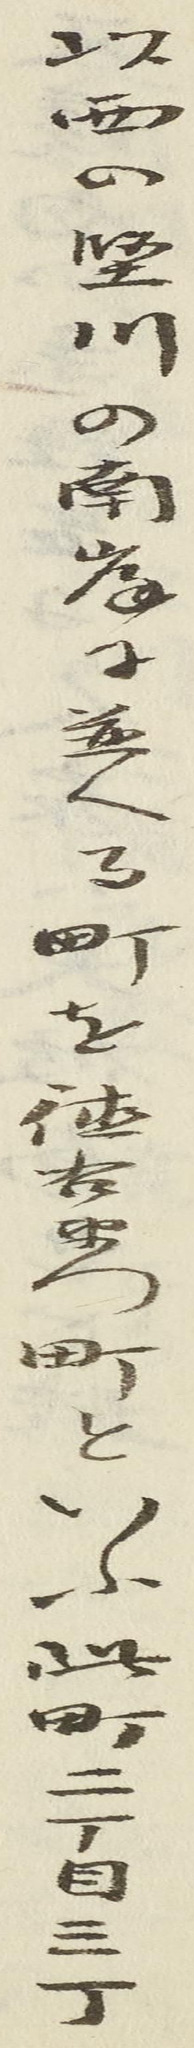以西の竪川の南岸に並へる町を徳右衛門町といふ此町二丁目三丁
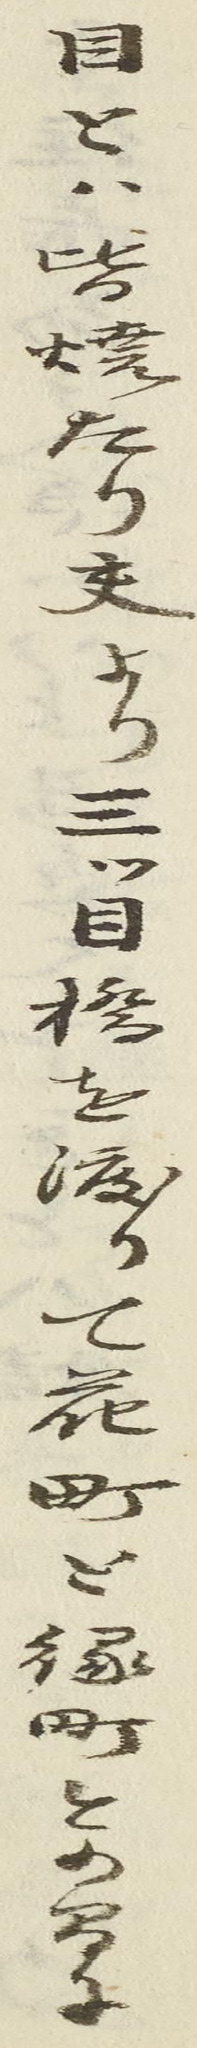目とハ皆焼たり夫より三ッ目橋を渡りて花町と緑町との間に
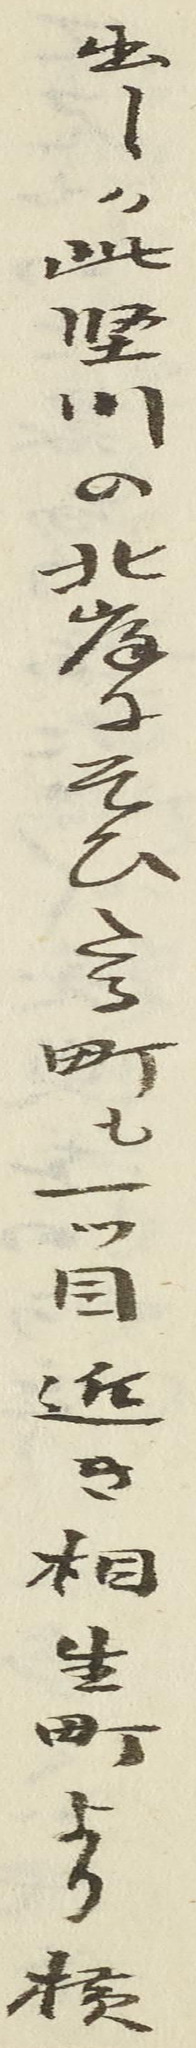出しか此竪川の北岸にそひたる町も一ッ目近き相生町より横
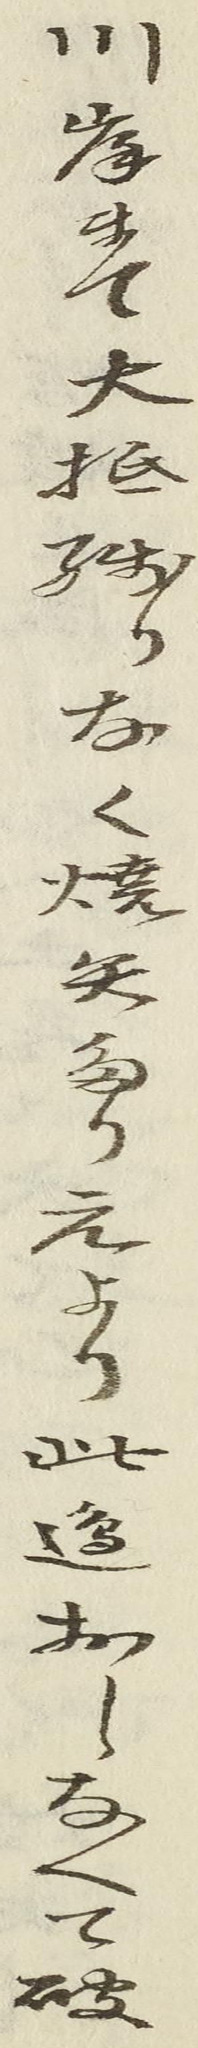川岸まて大低残りなく焼失たり元より此辺おしなへて破
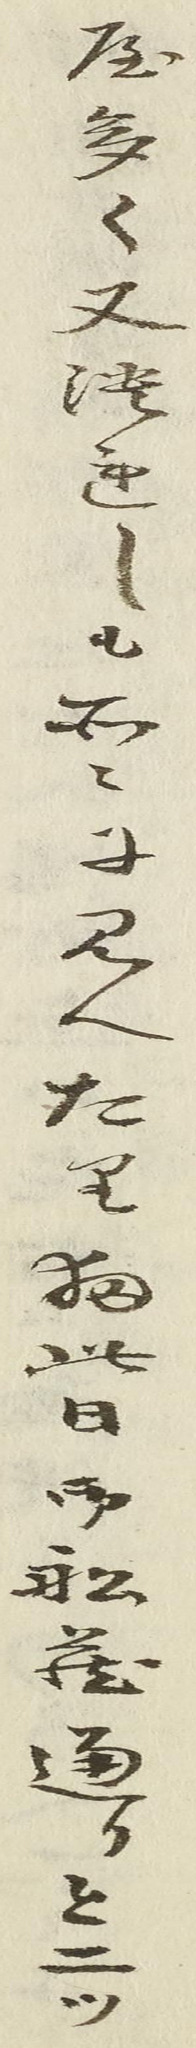屋多く又潰れしも所々に見へたり扨此日御船蔵通りと二ッ
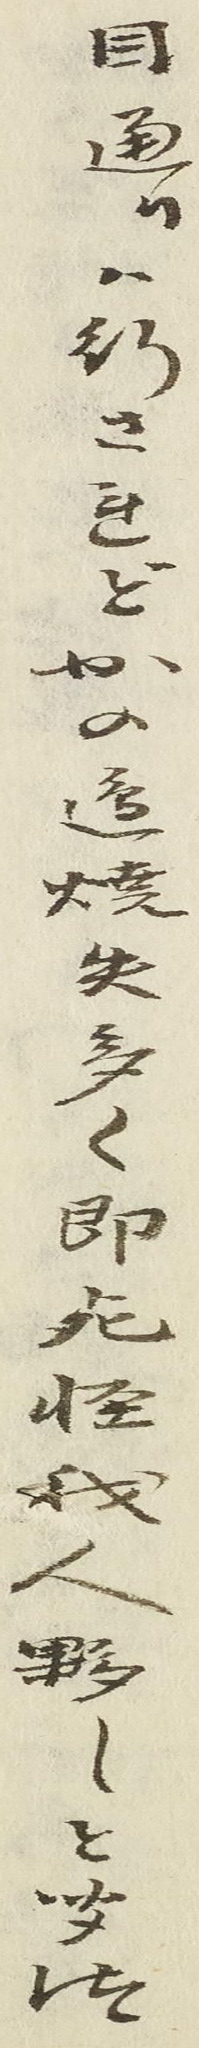目通りハ行されどかの辺焼失多く即死怪我人夥しと聞す
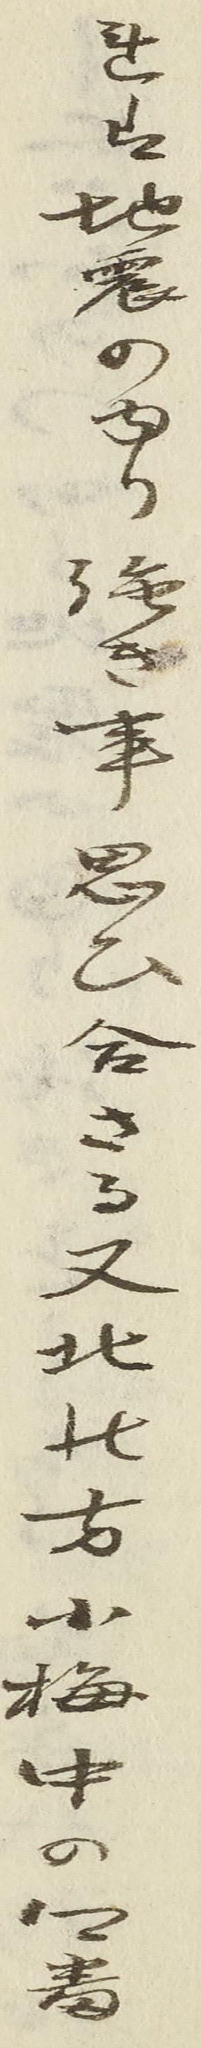れは地震のゆり強き事思ひ合さる又北の方小梅中の郷番
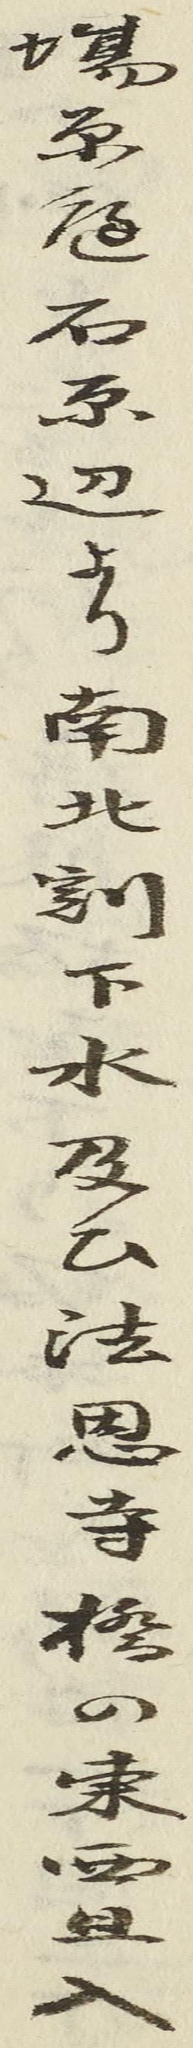場原庭石原辺より南北割下水及ひ法恩寺橋の東西且入
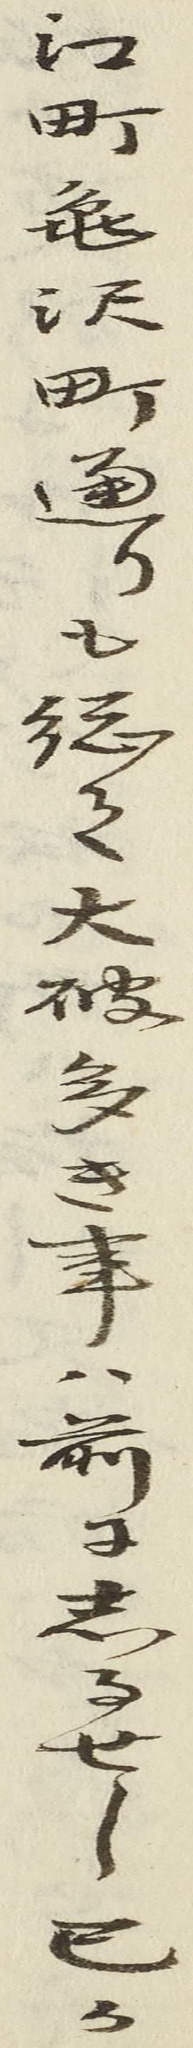江町亀沢町通りも総て大破多き事ハ前にしるせし己か
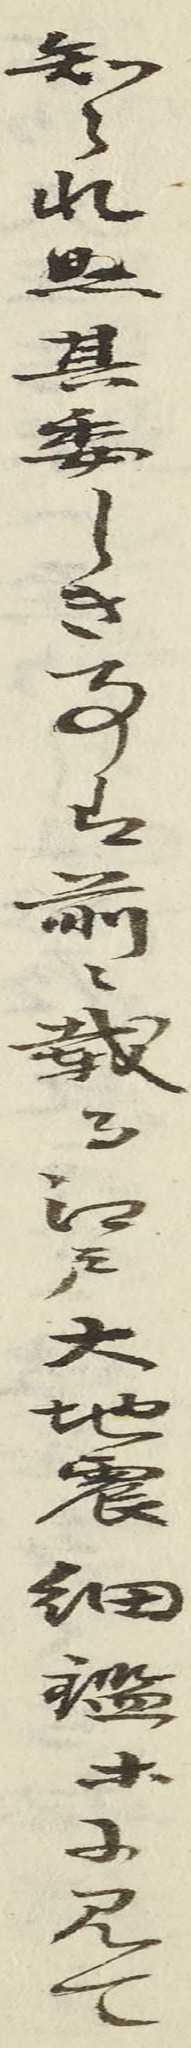知られぬ其委しき事は前二載る江戸大地震細鑑等に見て
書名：那為の後見艸　全
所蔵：東京大学地震研究所図書室 Earthquake Research Institute Library, The University of Tokyo, JAPAN
